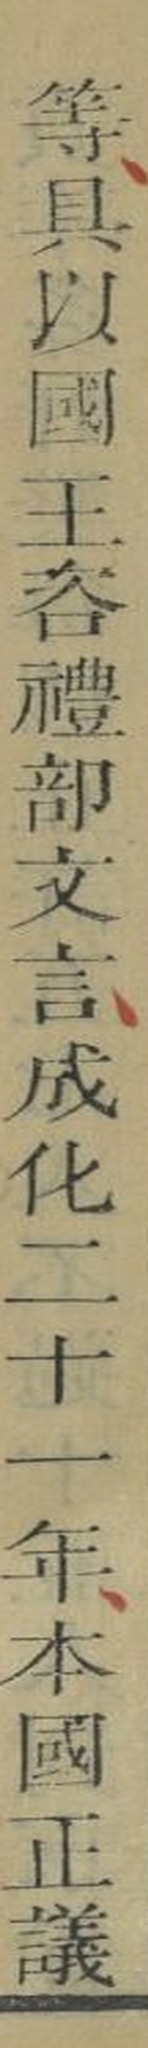等具以国王咨礼部文言成化二十一年本国正議
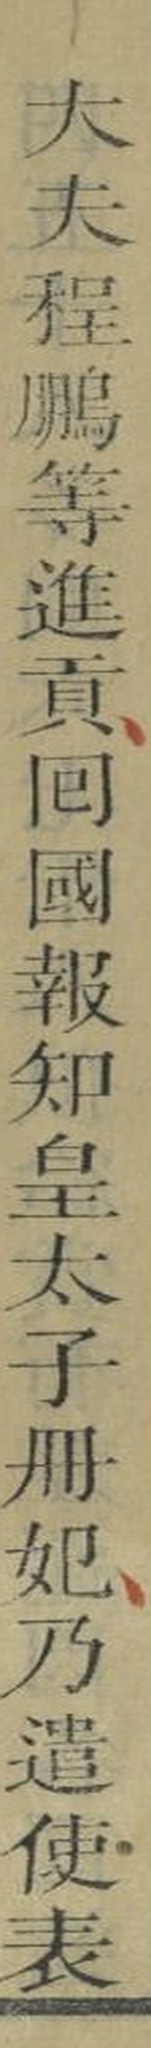大夫程鵬等進貢回国報知皇太子冊妃乃遣使表
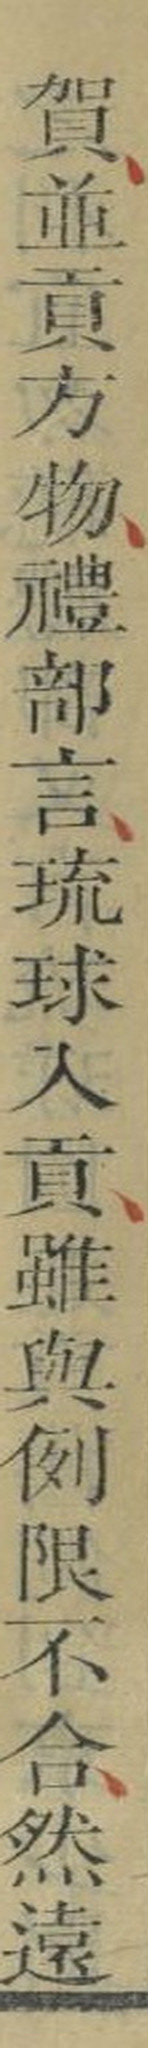賀並貢方物礼部言琉球入貢雖与例限不合然遠
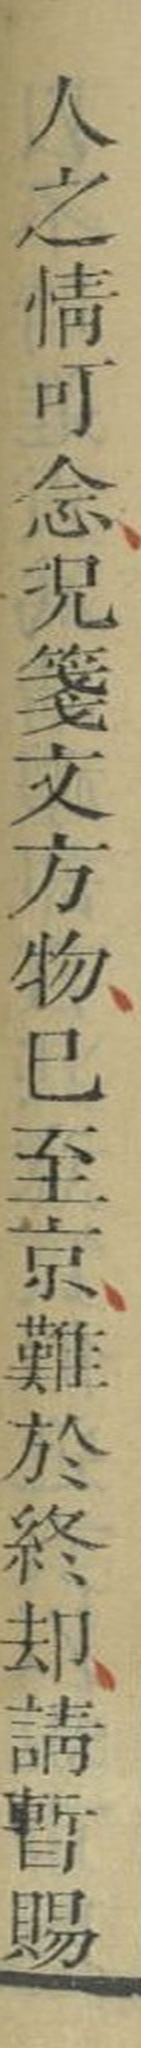人之情可念況箋文方物巳至京難於終却請暫賜
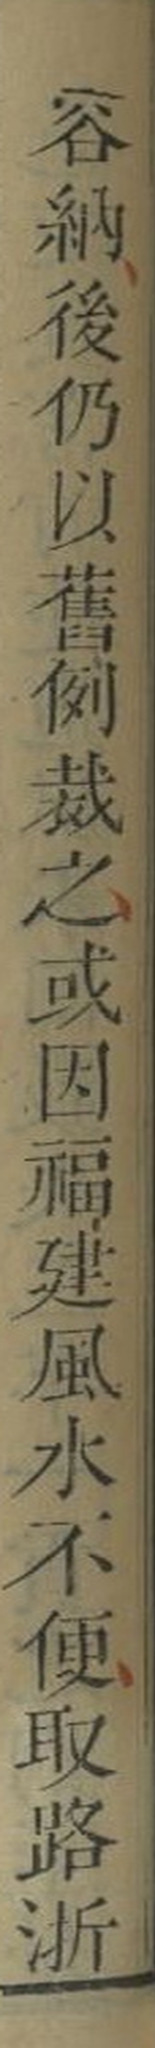容納後仍以旧例裁之或因福建風水不便取路浙
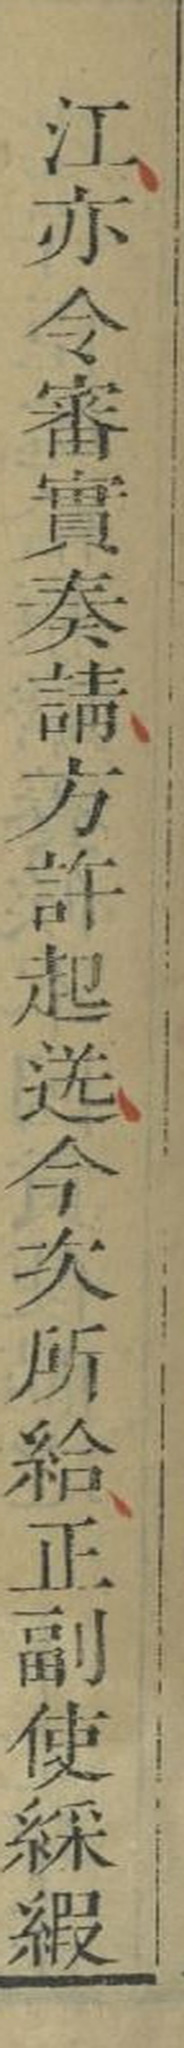江亦令審実奏請方許起送今次所給正副使綵緞
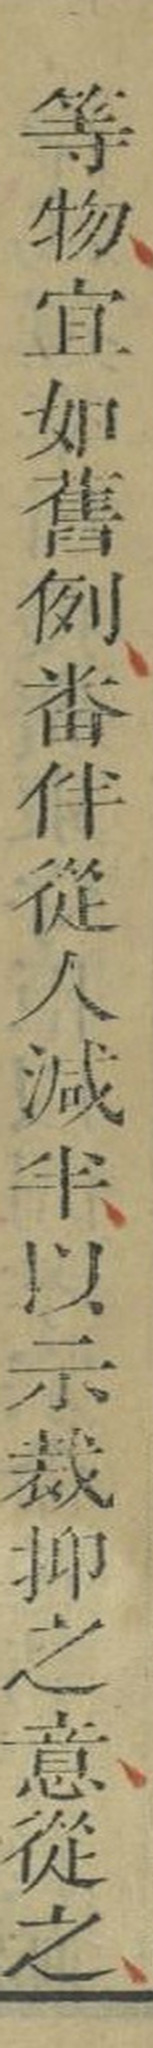等物宜如旧例畨伴従人減半以示裁抑之意従之
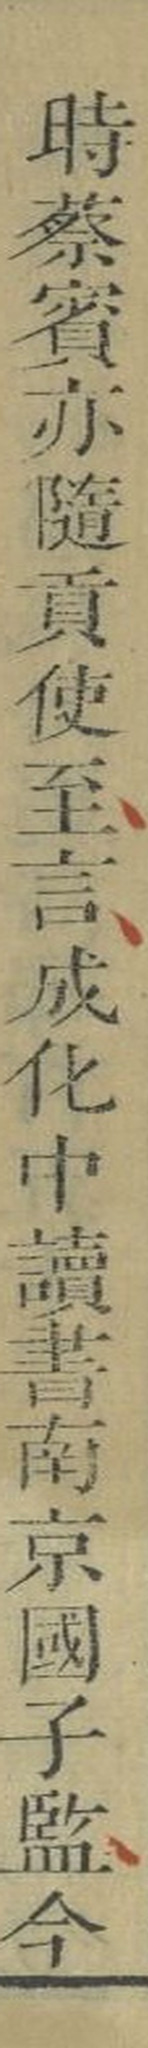時蔡賓亦随貢使至言成化中読書南京国子監今
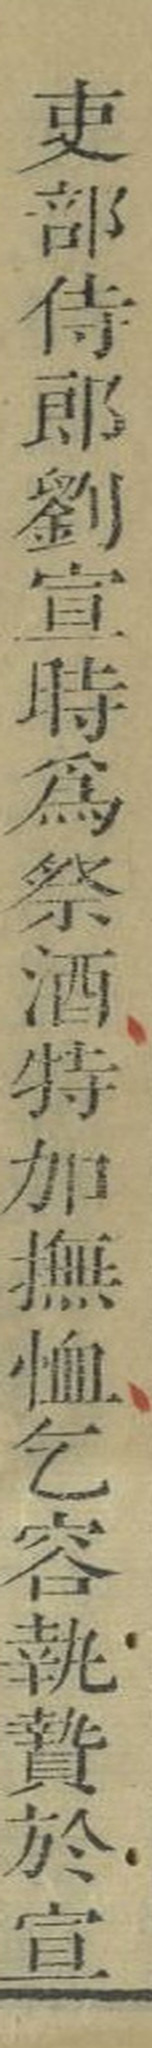吏部侍郎劉宣時為祭酒特加撫恤乞容執贄於宣
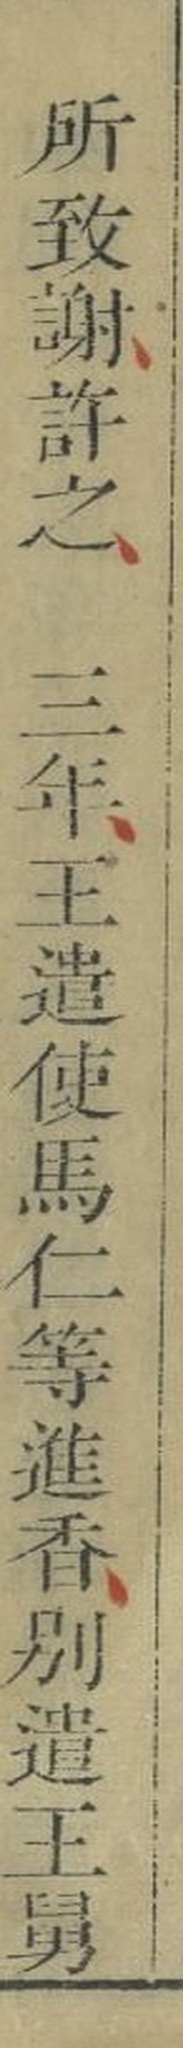所致謝許之三年王遣使馬仁等進香別遣王舅
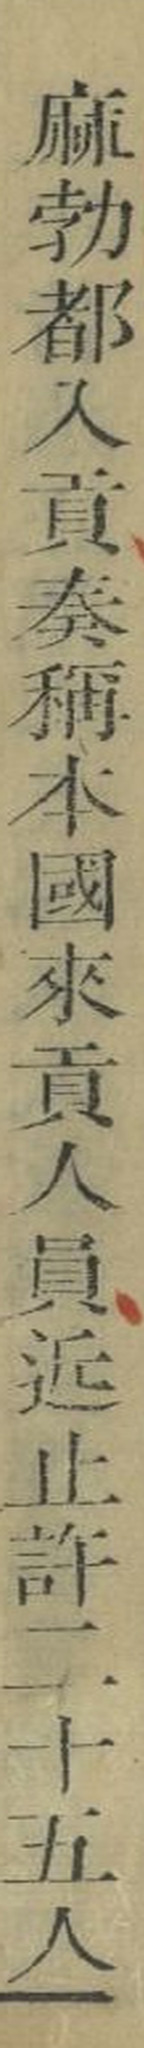麻勃都入貢奏称本国来貢人員近止許二十五人
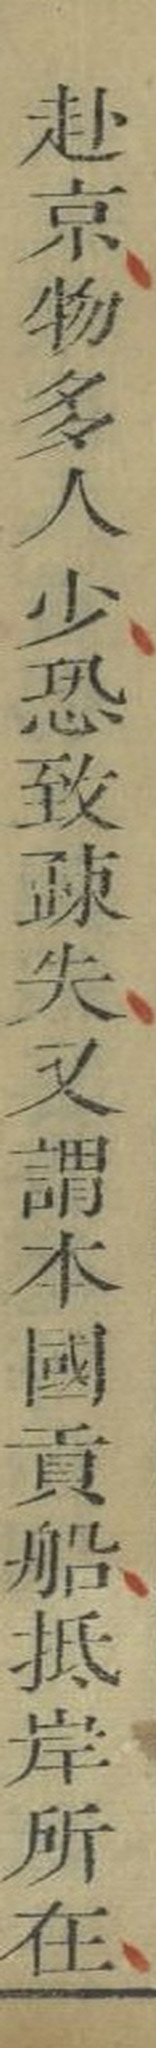赴京物多人少恐致疎失又謂本国貢船抵岸所在
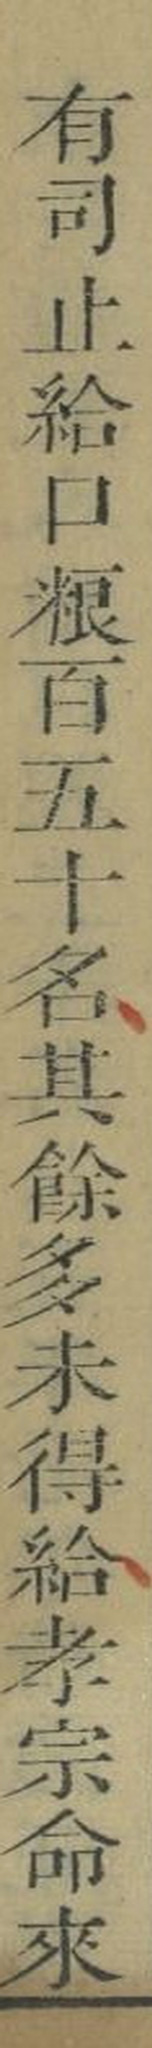有司止給口粮百五十名其余多未得給孝宗命来

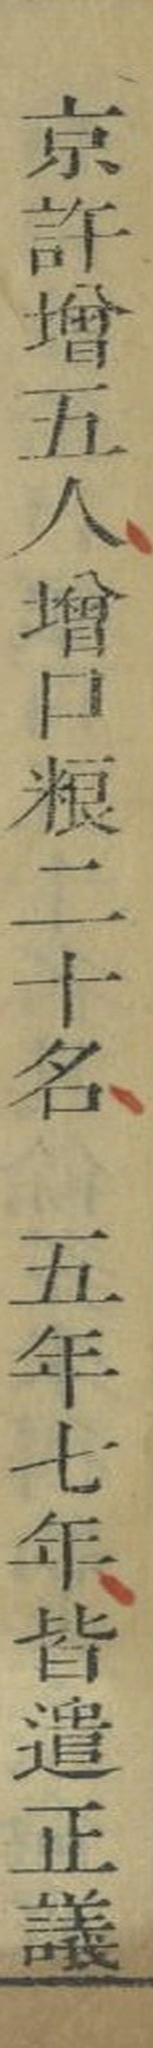京許増五人増口粮二十名五年七年皆遣正議
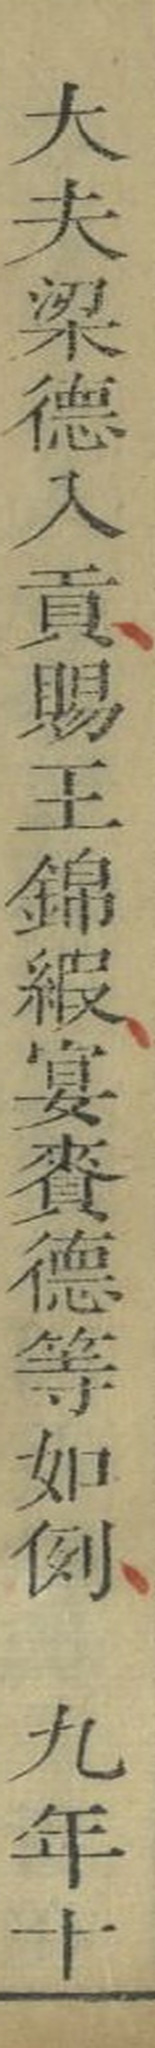大夫梁徳入貢賜王錦緞宴賚徳等如例九年十
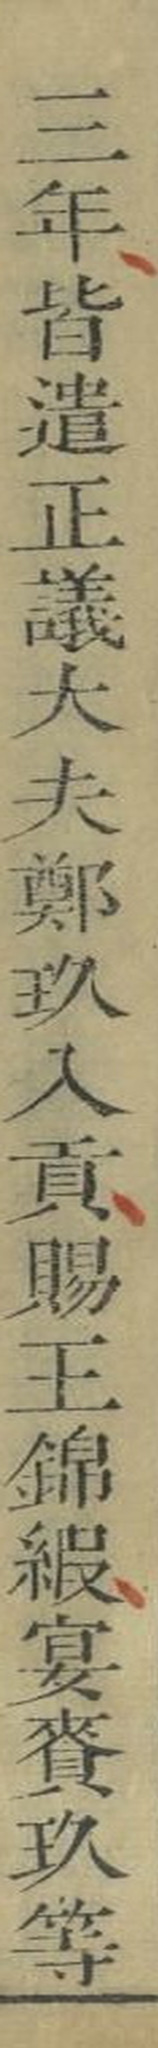三年皆遣正議大夫鄭玖入貢賜王錦緞宴賚玖等
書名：中山伝信録 巻三
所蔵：University of the Ryukyus Library
